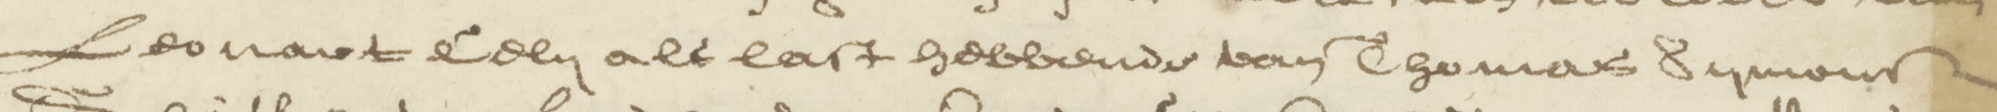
Leonart Coly als last hebbende van Thomas Symons
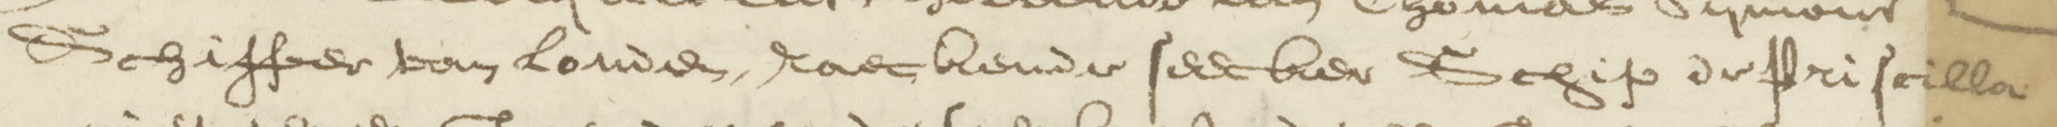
Schipper van Londen, raeckende seecker Schip de Priscilla
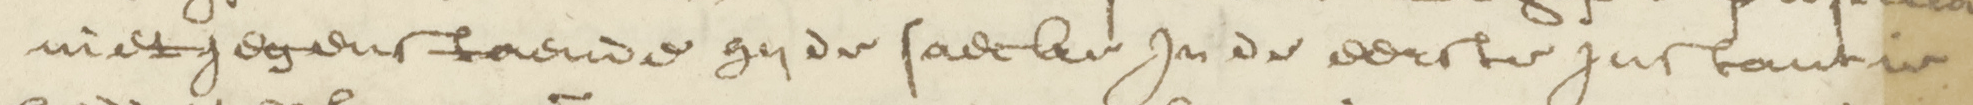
niet jegenstaende hy de saecke in de eerste instantie
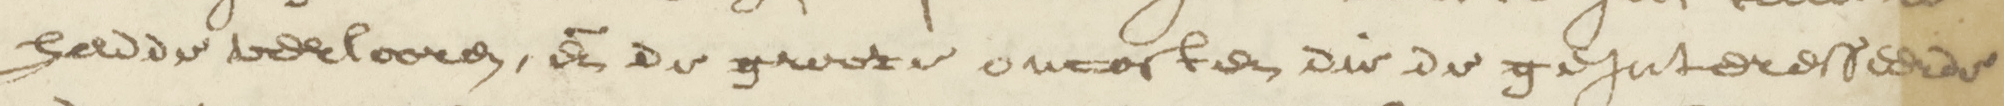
hadde verlooren, en de groote oncosten die de geinteresseerde
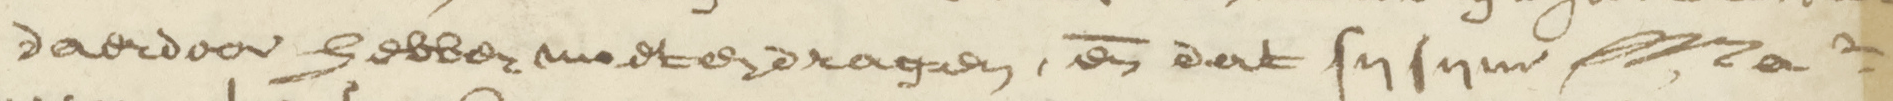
daerdoor hebben moeten dragen, en dat sy Syn Mat
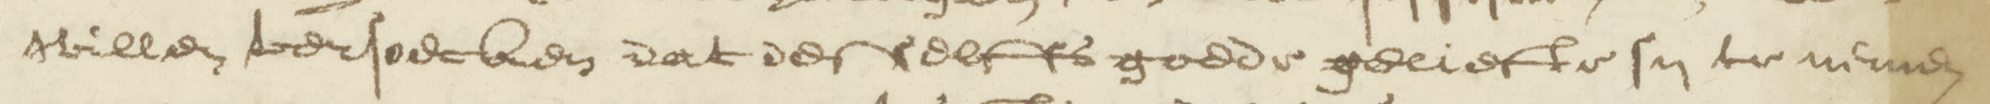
willen versoecken dat desselffs goede geliefte sy te nemen
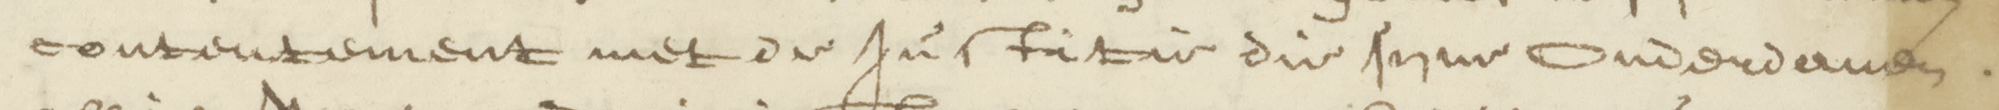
contentement met de justitie die syne onderdanen
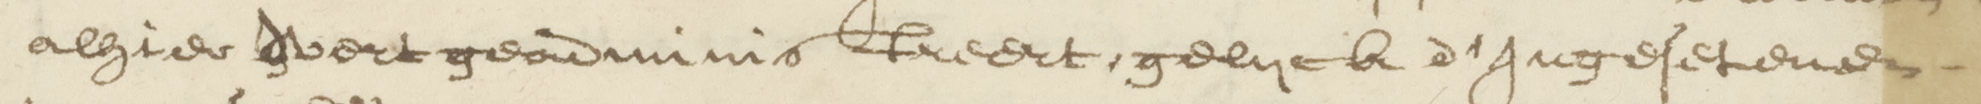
alhier wert geadministreert, gelyck d'ingesetenen
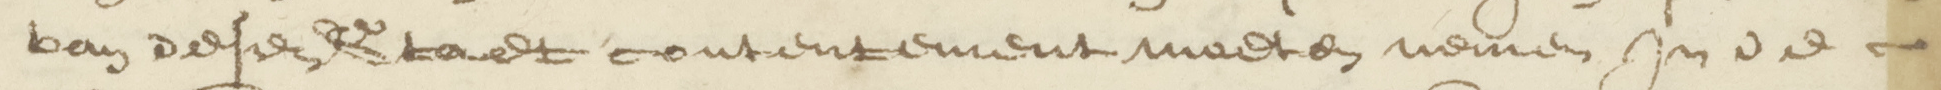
van desen Staet contentement moeten nemen in de
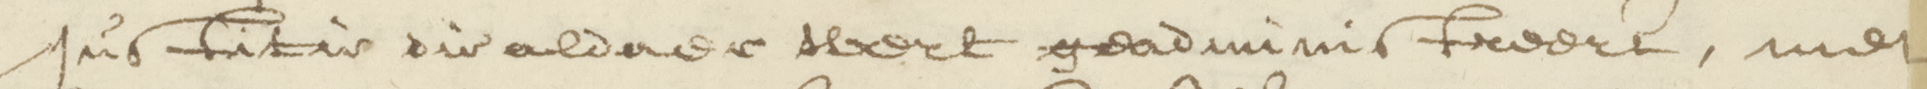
justitie die aldaer wort geadministreert, met
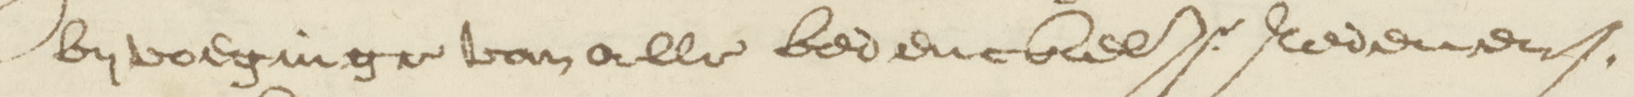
byvoeginge van alle bedenckel redenen.
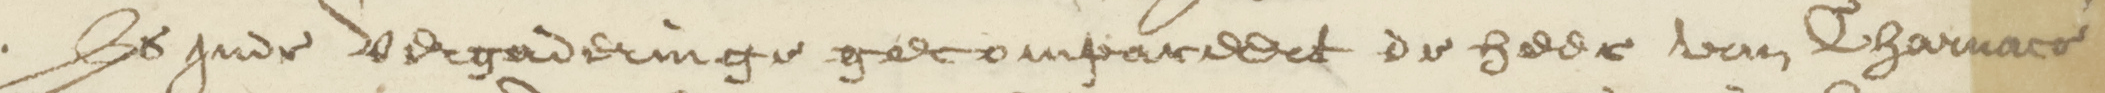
Is inde vergaderinge gecompareert de heer van Charnacé
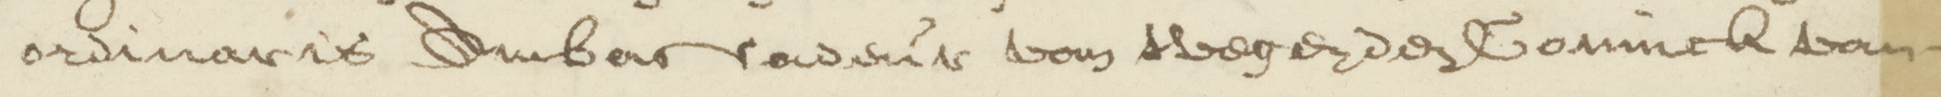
ordinaris Ambassadeur van wegen den Coninck van
